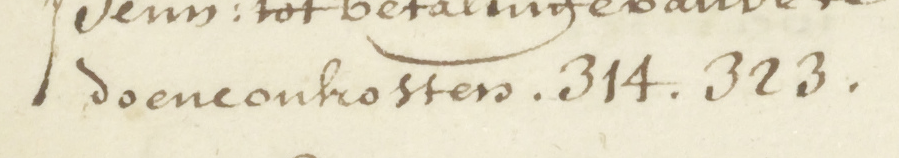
doene onkosten, 314, 323.
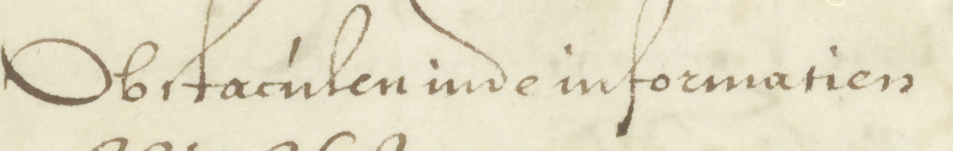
Obstaculen inde informatien
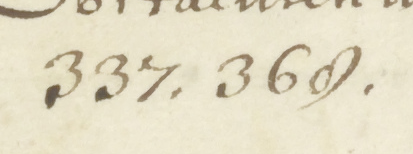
337, 368.
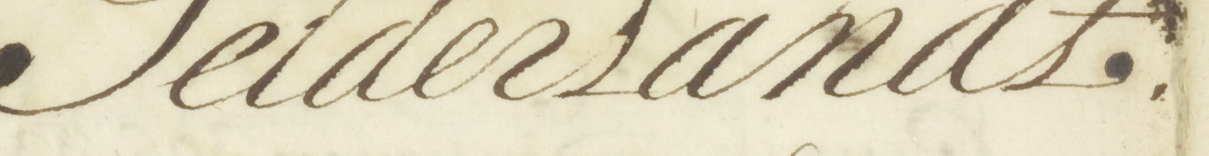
Gelderlandt
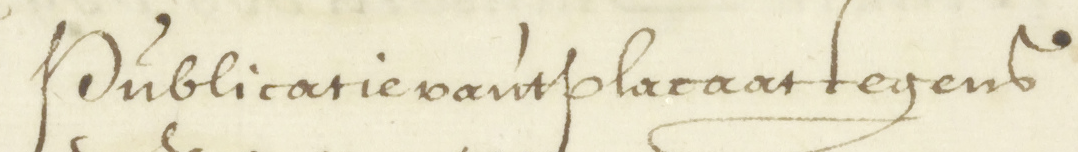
Publicatie van't placaat tegens
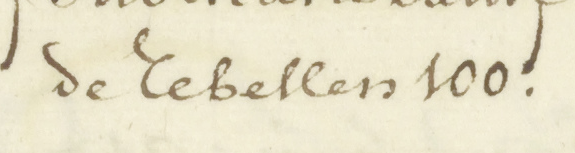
de rebellen 100.
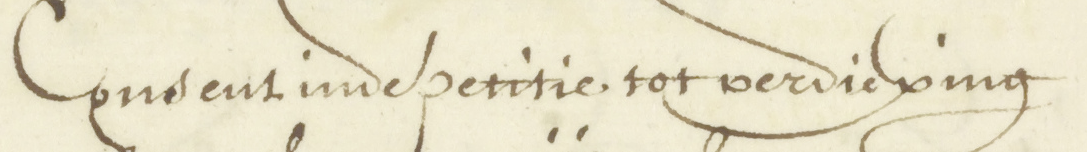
Consent inde Petitie tot verdieping
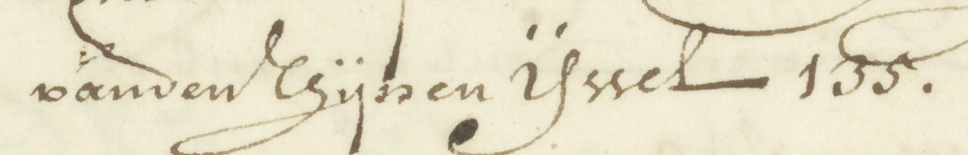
vanden Rhijn en IJsssel 135.
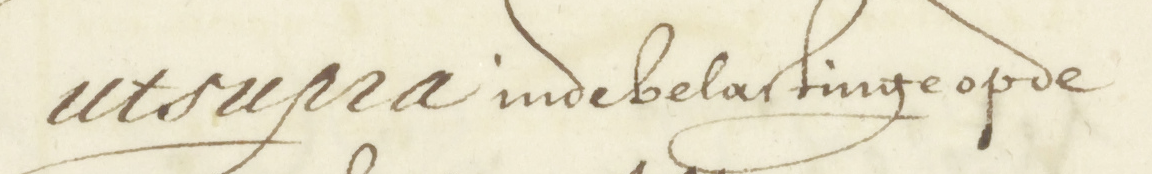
ut supra inde belastinge opde
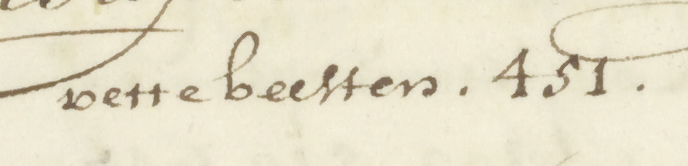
vette beesten, 451.
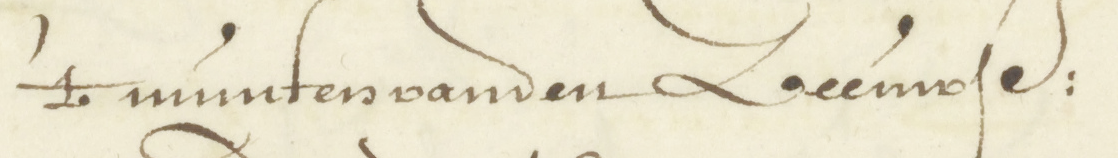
't munten vanden Zeeuwse:
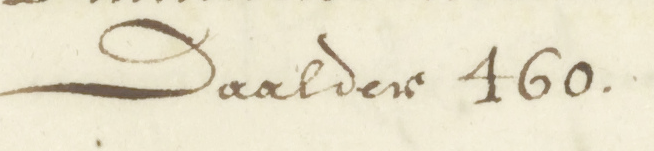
Daalder 460.
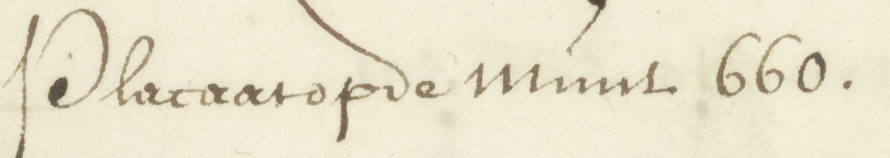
Placaat opde Munt, 660.
